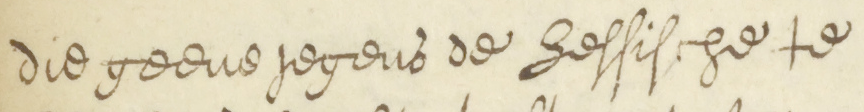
die geene jegens de hessische te
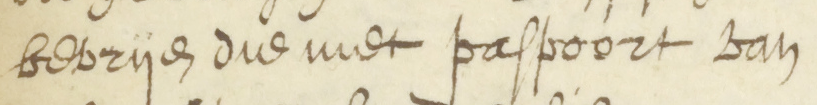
bevrijen die met paspoort van
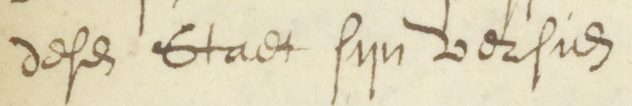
desen Staet syn versien
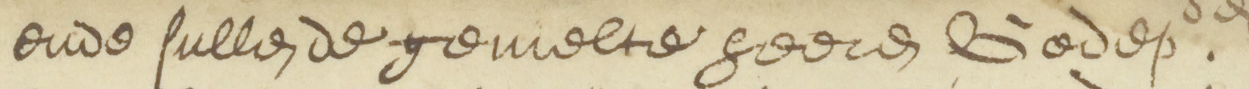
ende sullen de gemelte heeren Gedepden.
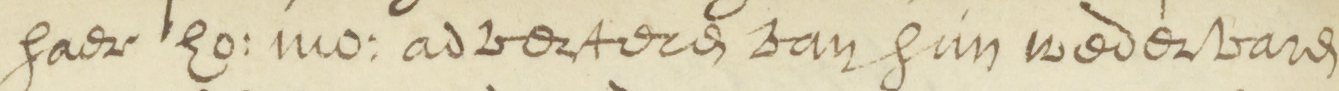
haer ho:mo: adverteren van hun wedervaren
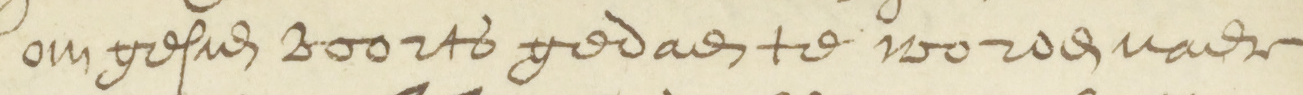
om gesien voorts gedaen te worden naer
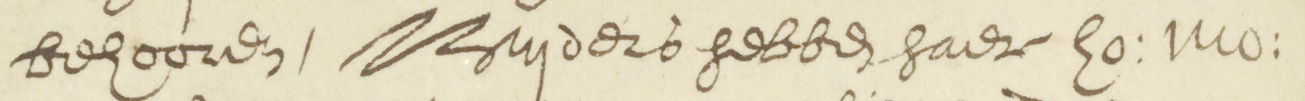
behooren. Wyders hebben haer ho:Mo:
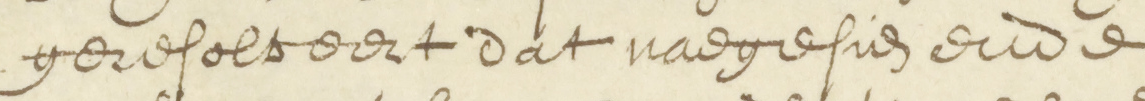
geresolveert dat naegesien ende
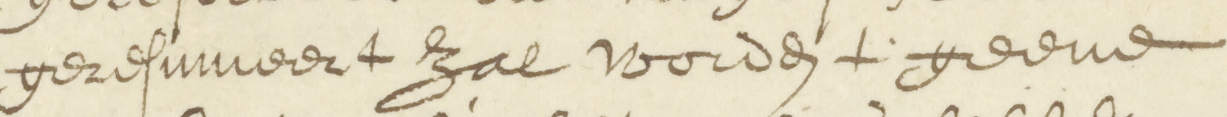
geresumeert zal worden t'geene
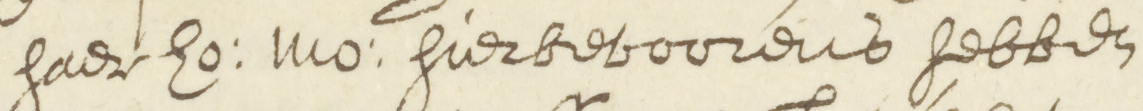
haer ho:Mo: hierbevoorens hebben
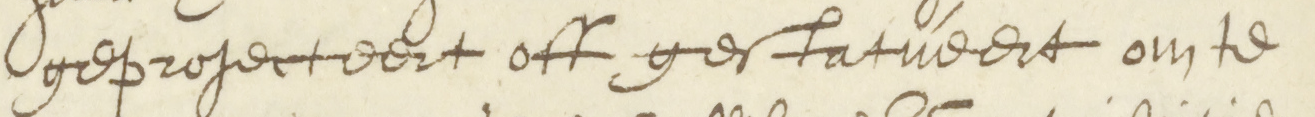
geprojecteert off gestatueert om te
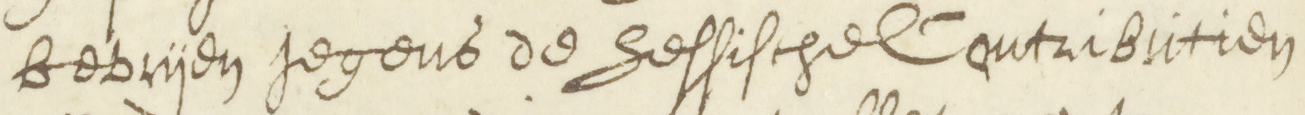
bevrijen jegens de hessische Contributien
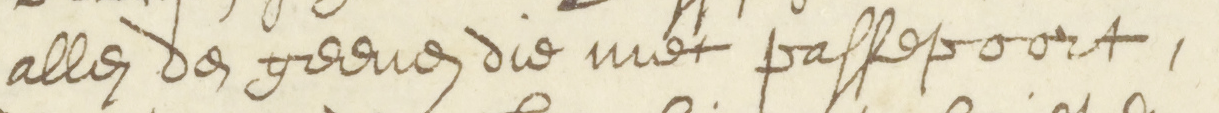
allen den geenen die met passepoort,
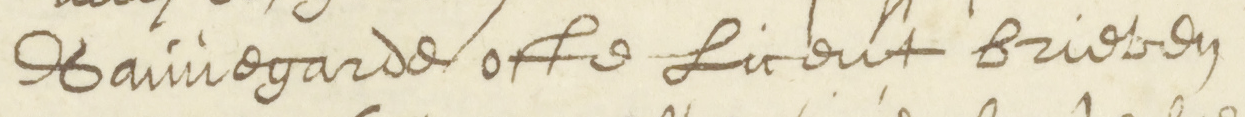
Sauuegarde ofte Licent brieven
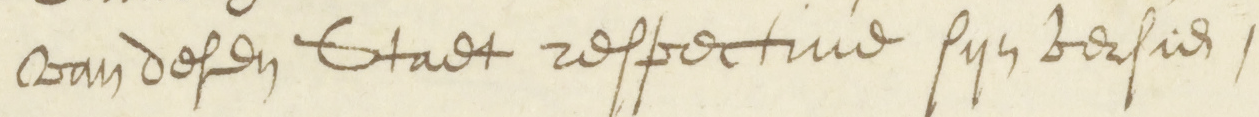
van desen Staet respectiue syn versien.
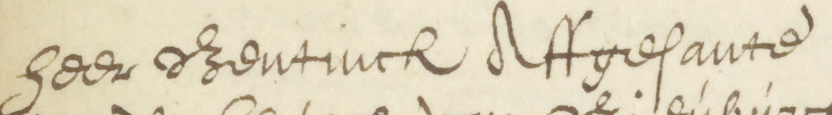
heer Bentinck Affgesante
